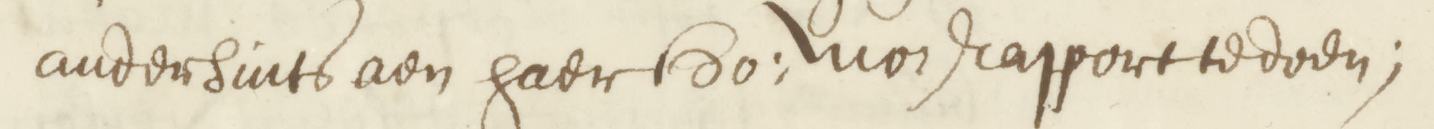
andersints aen haer ho:mo: rapport te doen;
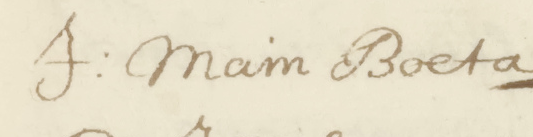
J. Main Boeta
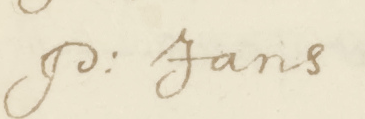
P: Jans
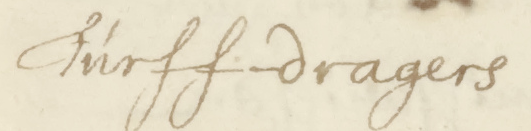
Turff-drager
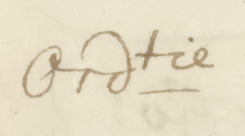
Ordtie
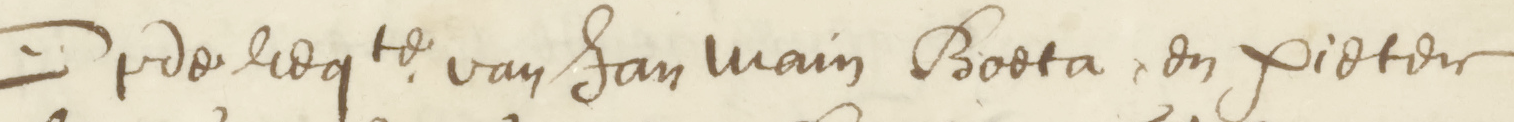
Opde reqte. van Jan Main Boeta en Pieter
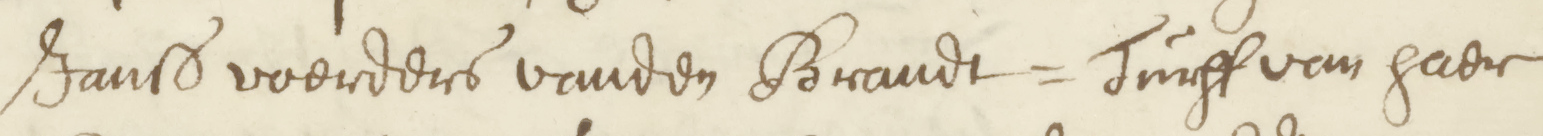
Janss voerders vanden Brandt=Turff van haer
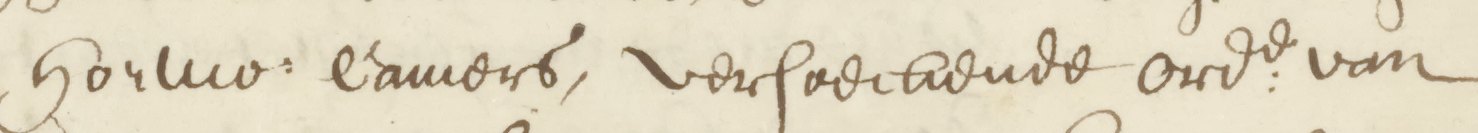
ho:mo: Camers, versoeckende orde: van
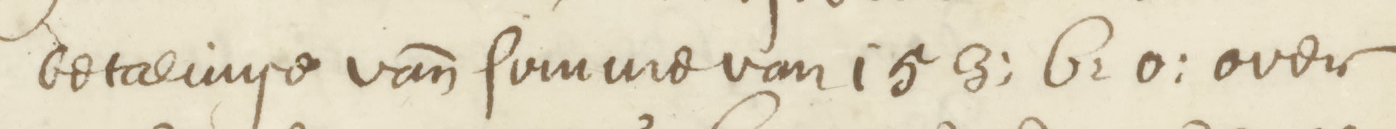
betalinge van somme van 153: 6: 0 over
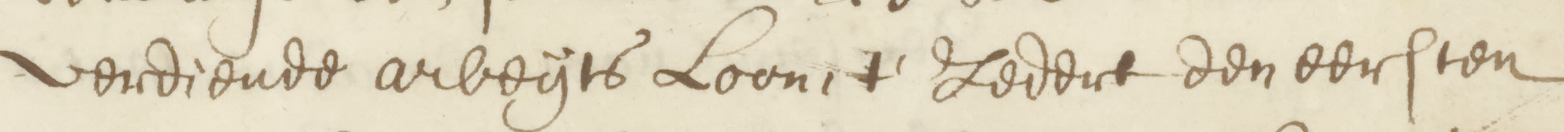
verdiende arbeijts Loon, t‛ Zedert den eersten
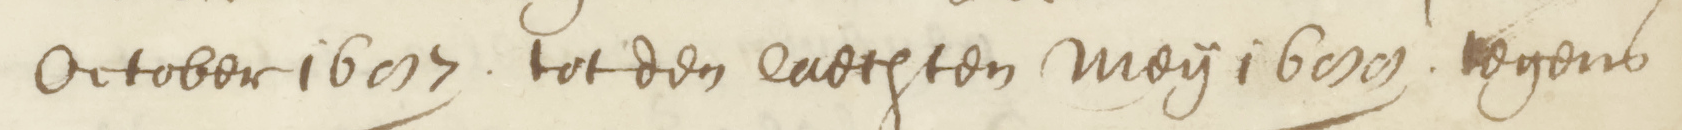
october 1687, tot den laetsten meij 1688 tegens
